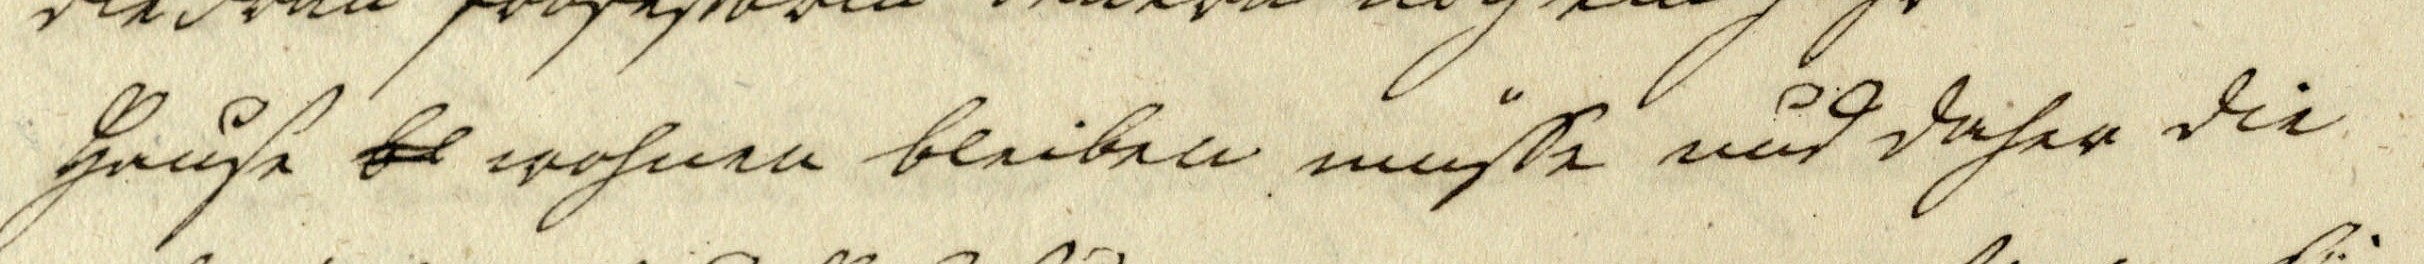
Hause be wohnen bleiben müsse und daher die
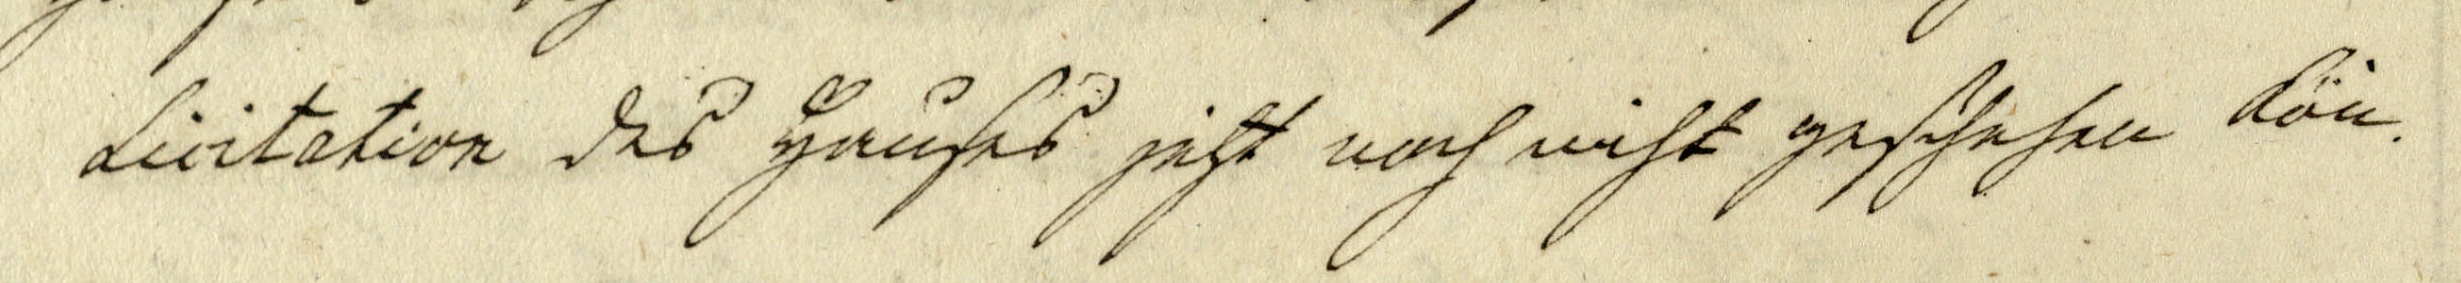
Licitation des Hauses jetzt noch nicht geschehen kön¬
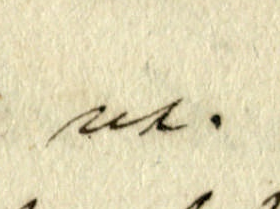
ne.
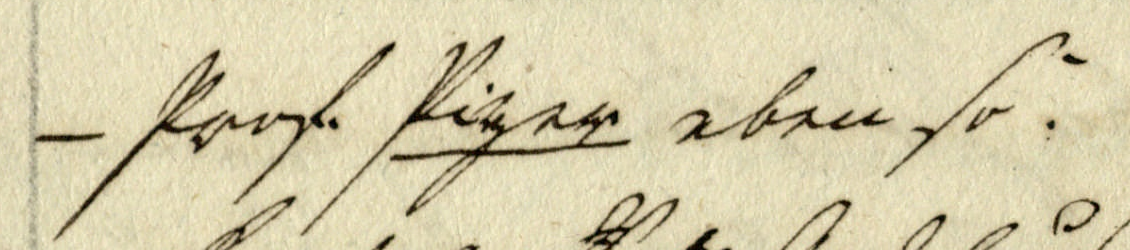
Prof. Piper eben so.
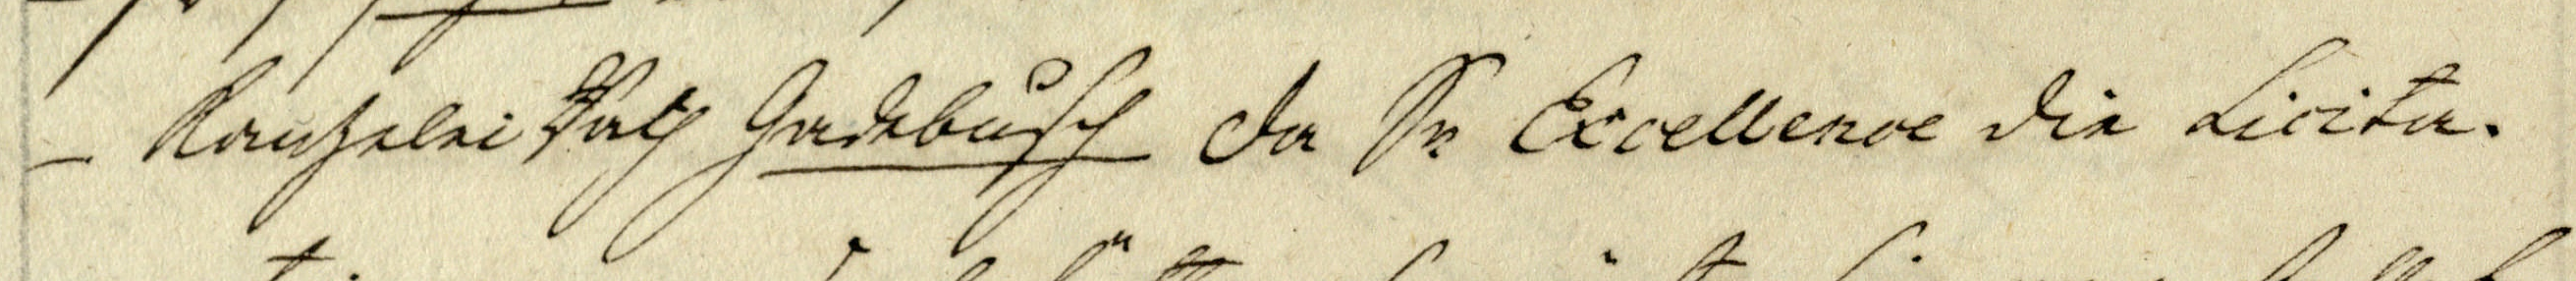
Kanzelei Rath Gadebusch Da Sr Excellence die Licita¬
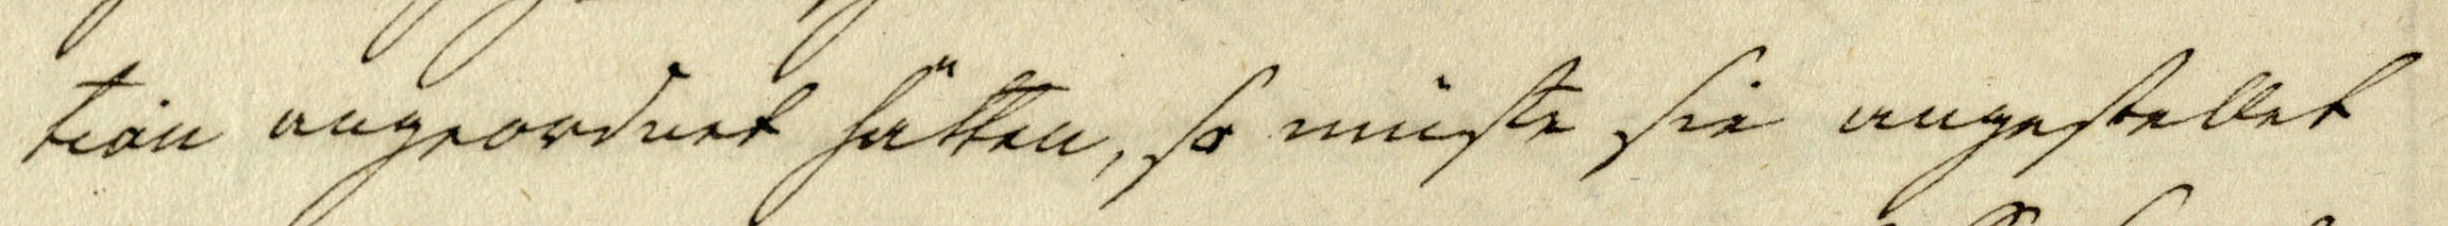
tion angeordnet hätten, so müßte sie angestellet
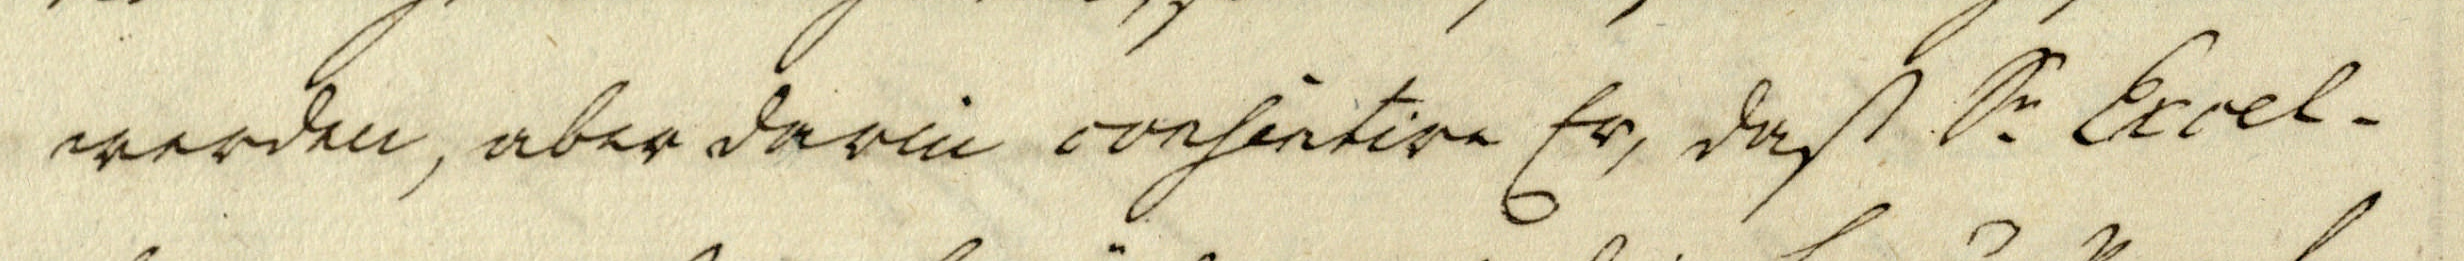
werden, aber darin consentire Er, daß Sr Excel¬
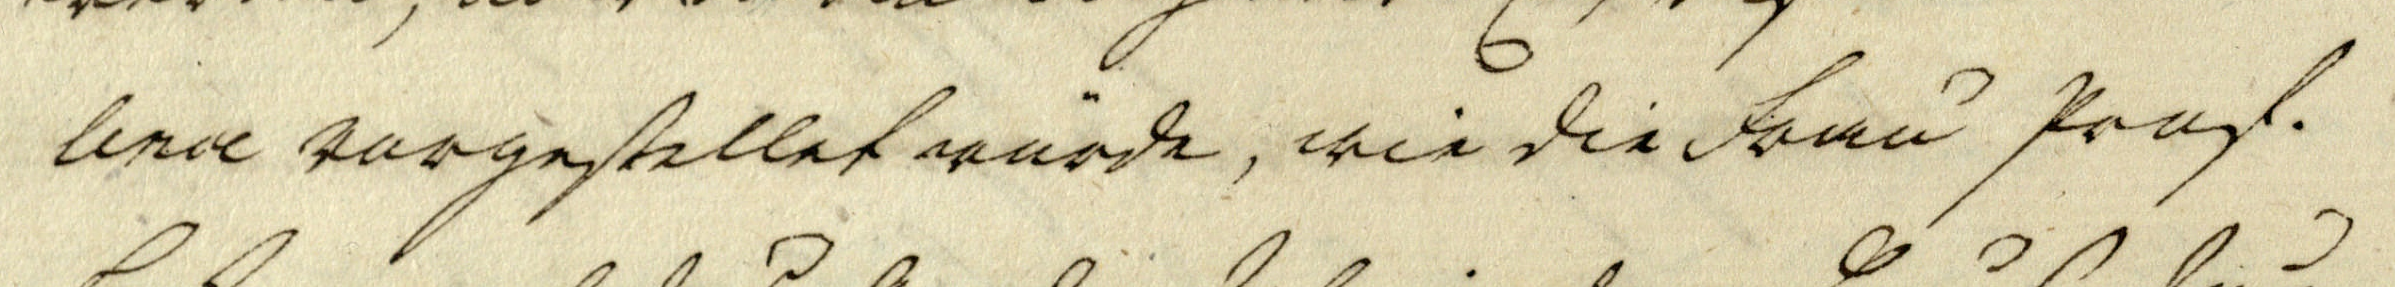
lence vorgestellet würde, wie die Frau Prof.
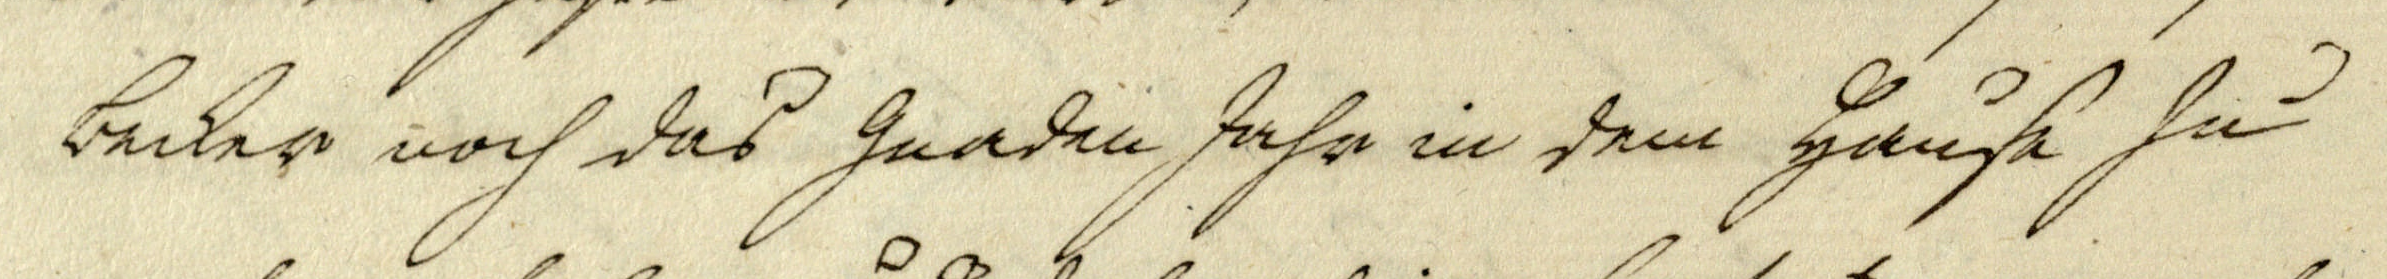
Becker noch das Gnaden Jahr in dem Hause zu
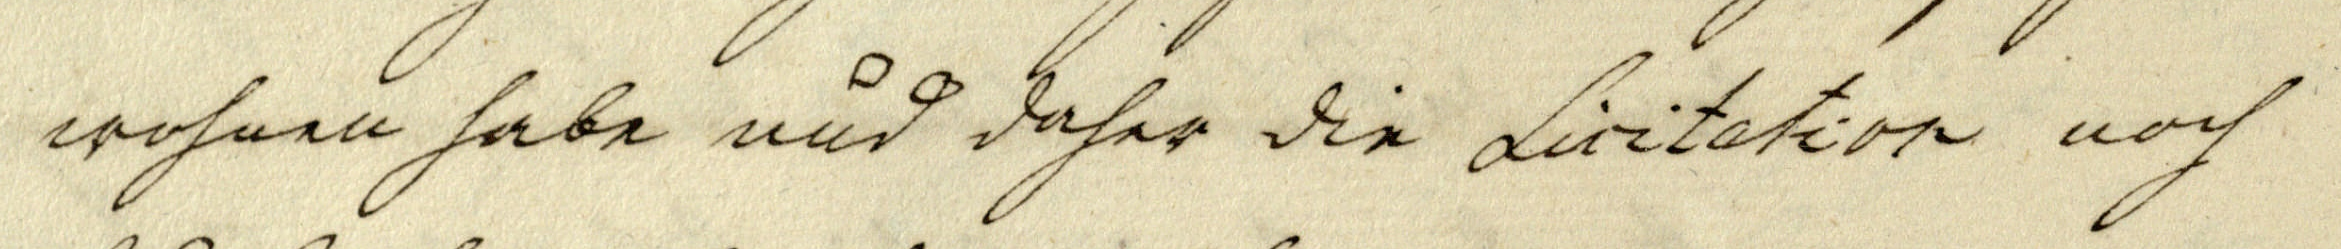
wohnen habe und daher die Licitation noch
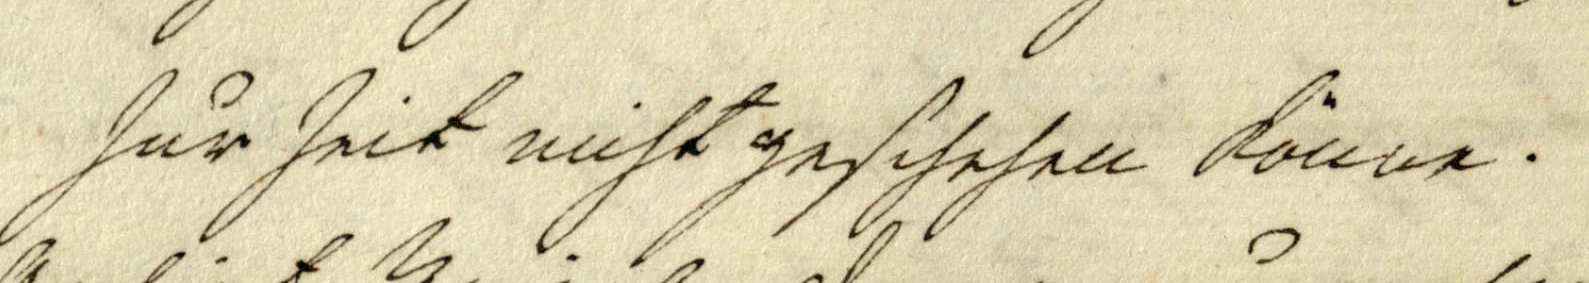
zur Zeit nicht geschehen könne.
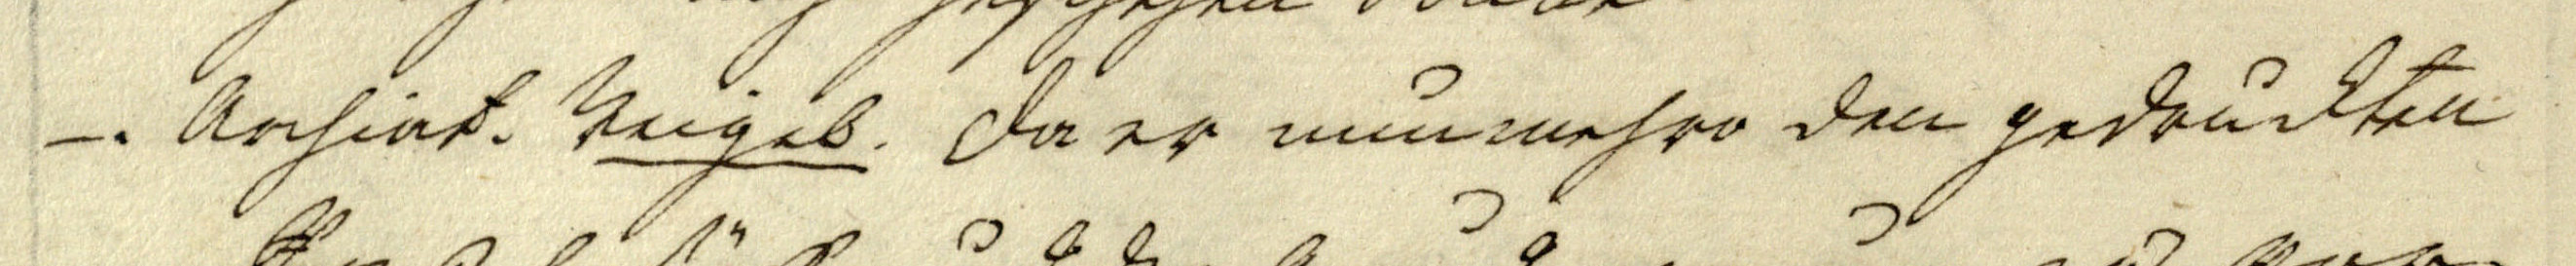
Archiat. Weigel. Da er nunmehro den gedruckten
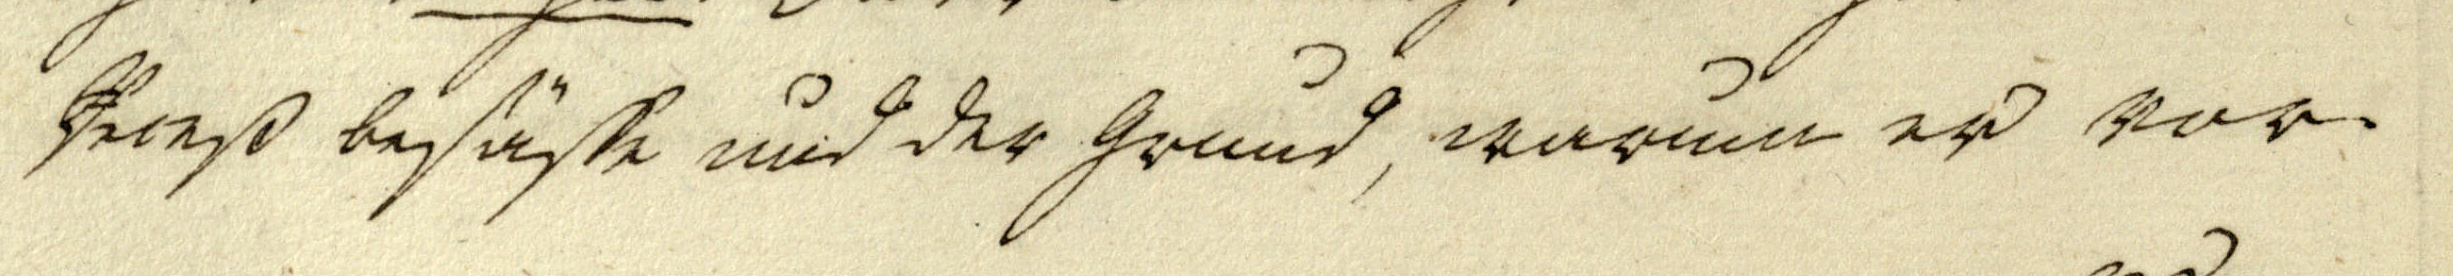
Receß besässe und der Grund, warum er vor¬
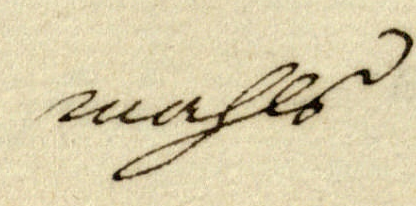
mahls
